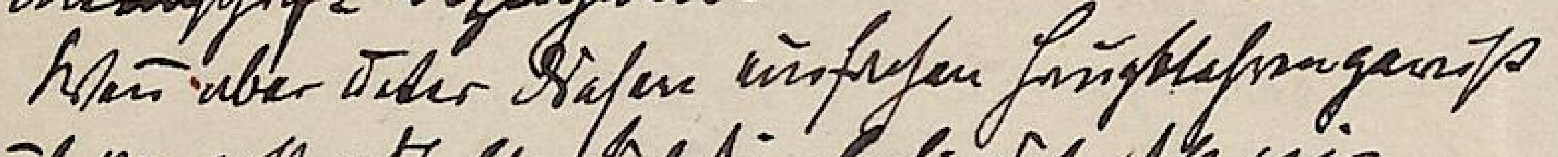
Wen aber unter diesen einfachen Hauptsachen gewiß
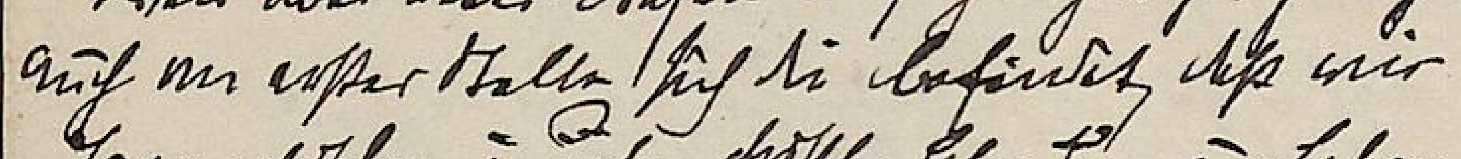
auch an erster Stelle sich die befindet, daß wir
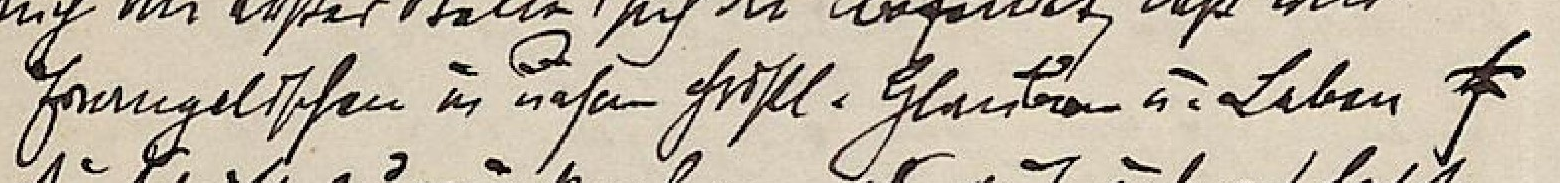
Evangelischen in unserm christl. Glauben u. Leben f
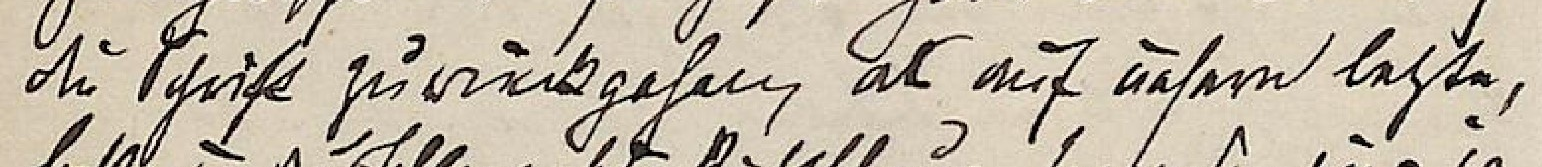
die Schrift zurcükgehen, als auf unsere. letzte,
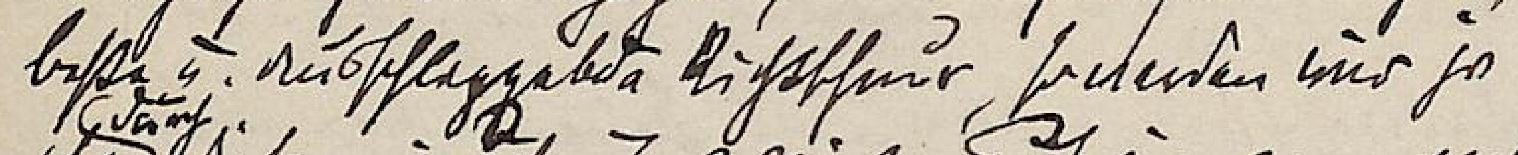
beste u. ausschlaggebde Richtschnur so werden wir ja
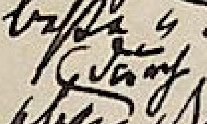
auch
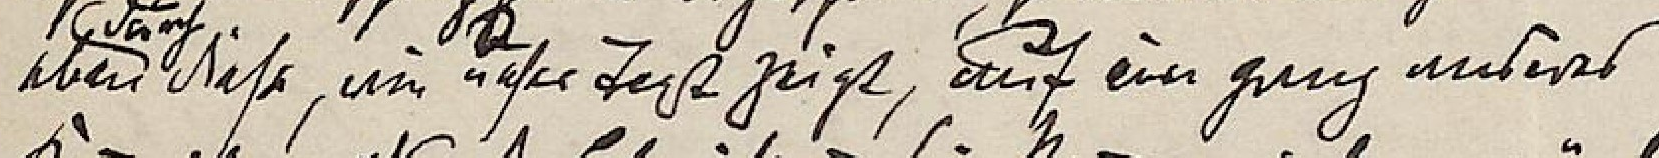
eben diese, wie unser Text zeigt, auf ein ganz anderes
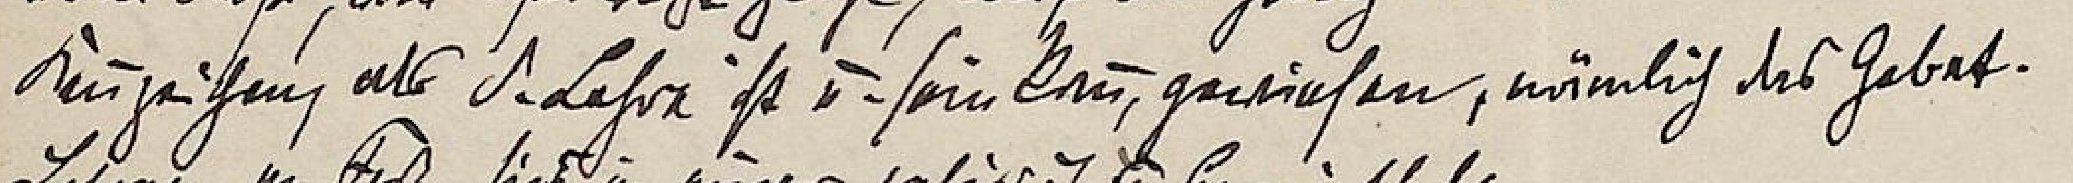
Kenzeichen, als d. Lehre ist u. sein kan, gewiesen, nämlich das Gebet.
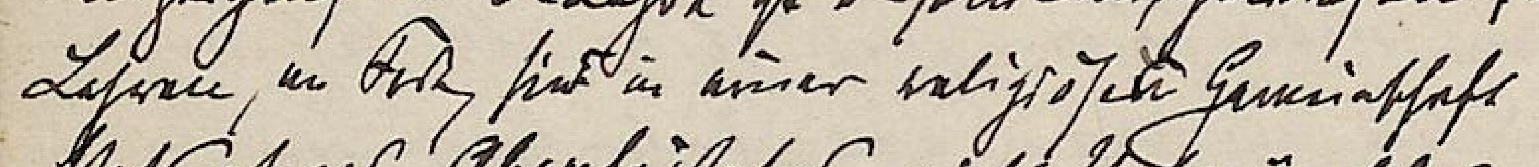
Lehren, m Frde, sind in einer religiösen Gemeinschaft
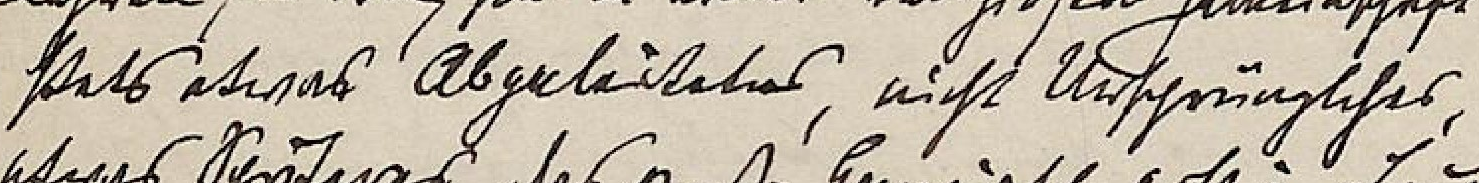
stets etwas Abgeleitetes, nicht Ursprüngliches,
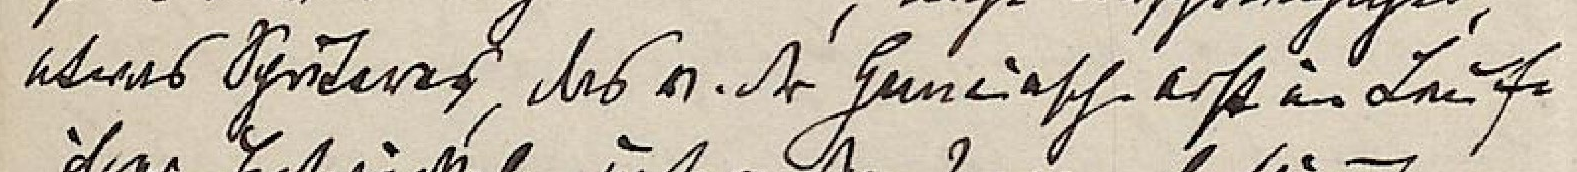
etwas Späteres, das v. der Gemeinsch. erst ein Laufe
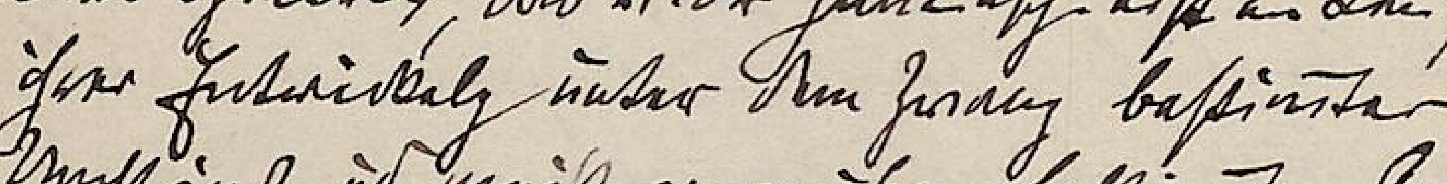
ihrer Entwickelg. unter dem Zwang, bestimmter
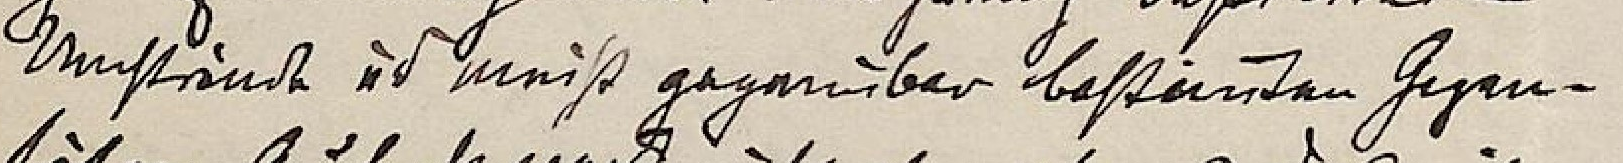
Umstände und meist gegenüber bestimmten Gegen¬
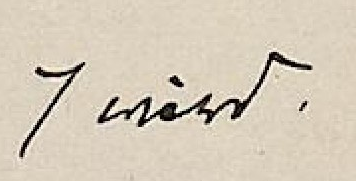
wird
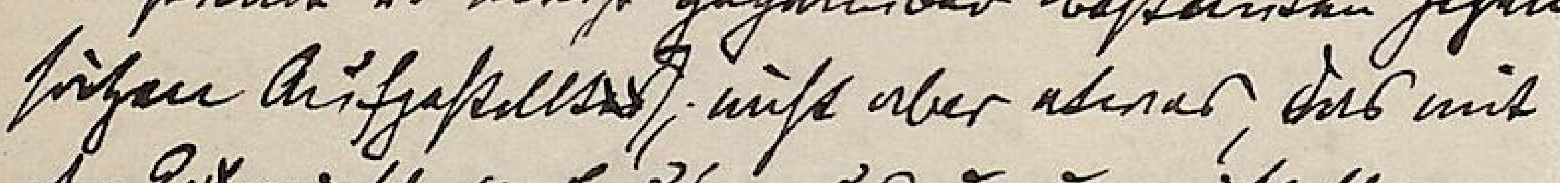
sätzen Aufgestelles], nicht aber etwas, das mit
